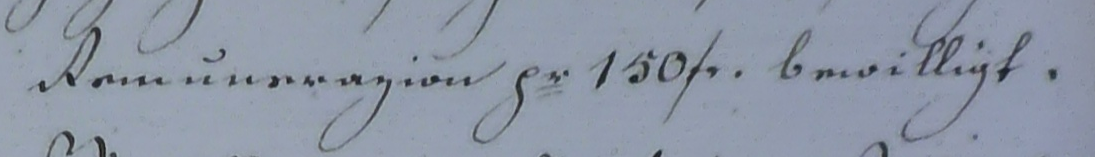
Remunerazion pr 150fr. bewilligt.
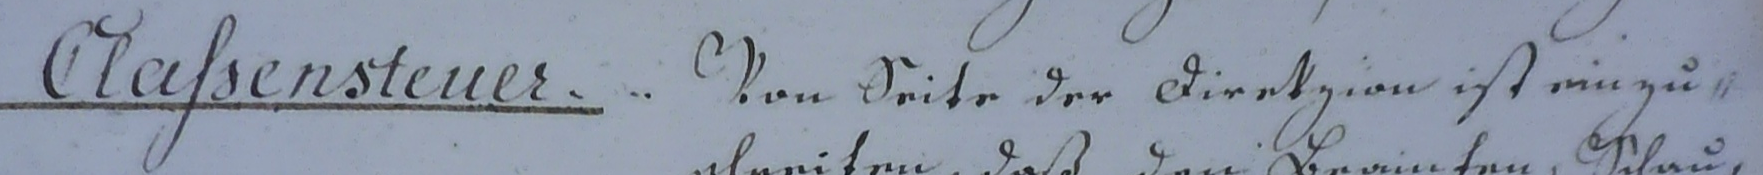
Classensteuer .. .. Von Seite der Direkzion ist einzu¬
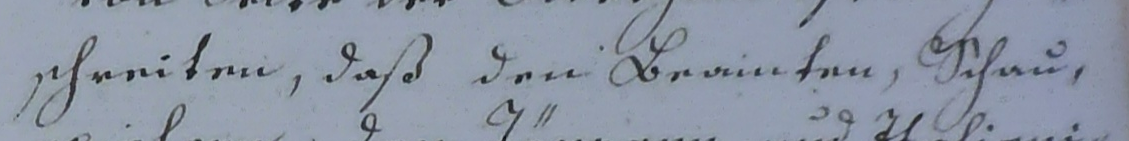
schreiten, daß den Beamten, Schau¬
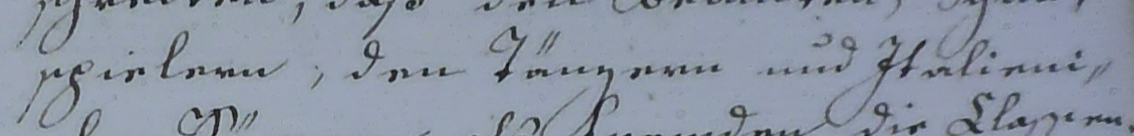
spielern, den Tänzern und Italieni¬
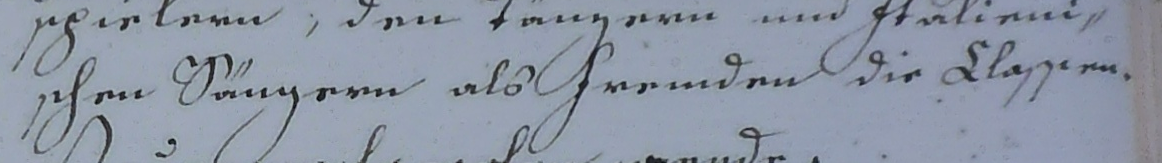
schen Sängern als Fremden die Classen¬
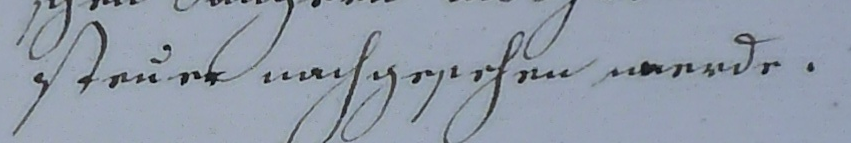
steuer nachgesehen werde.
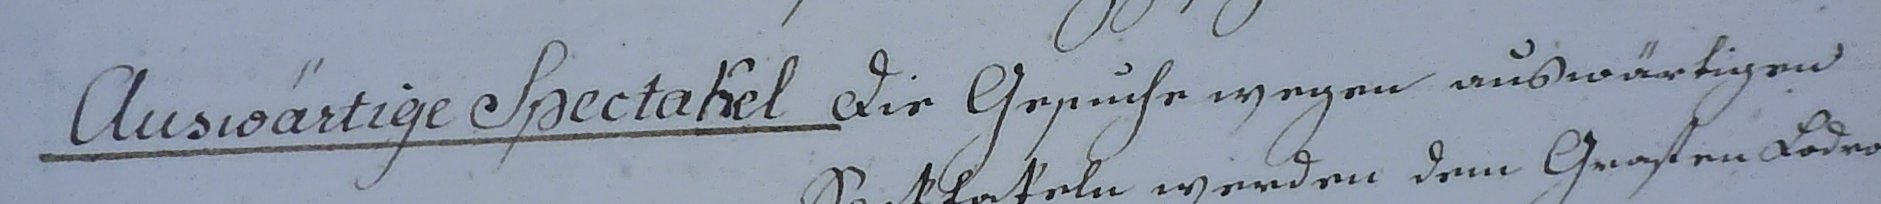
Auswärtige Spectakel Die Gesuche wegen auswärtigen
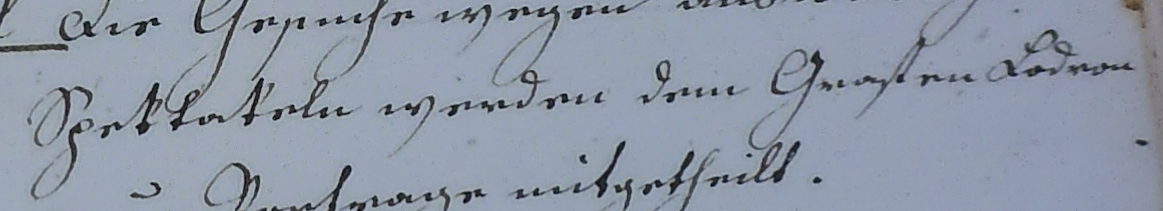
Spektakeln werden dem Grafen Lodron
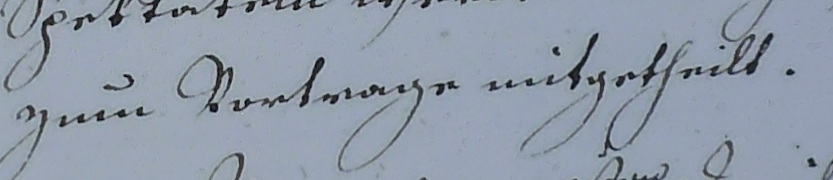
zum Vortrage mitgetheilt.
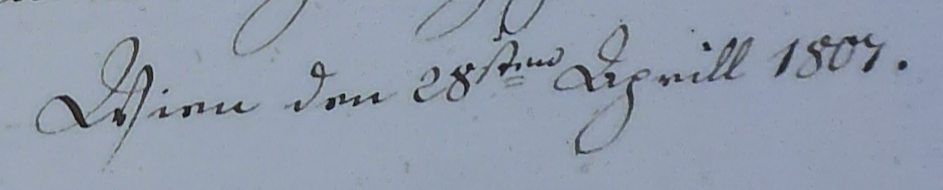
Wien den 28ste͇n Aprill 1807.
